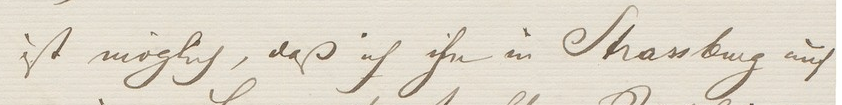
ist möglich, daß ich ihn in Strassburg auf
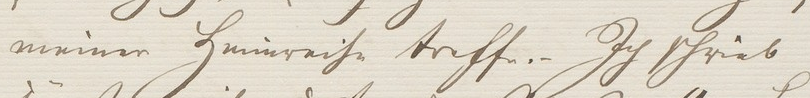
meiner Heimreise treffe. – Ich schrieb
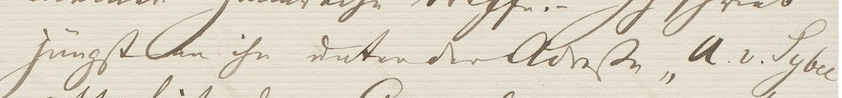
jüngst an ihn unter der Adreße «A. v. Sybel
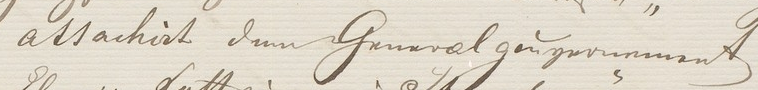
attachirt dem Generalgouvernement
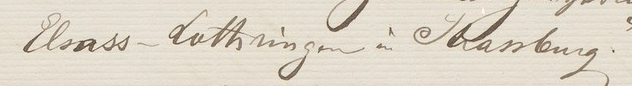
Elsass-Lothringen in Strassburg.»
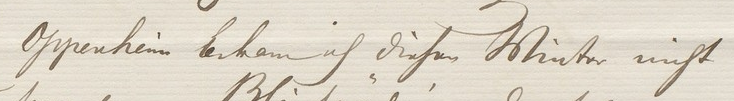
Oppenheim bekam ich diesen Winter nicht
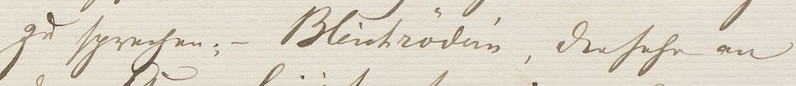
zu sprechen; – Bleichröder, der sehr an
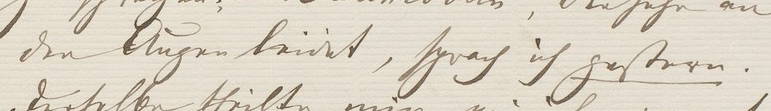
den Augen leidet, sprach ich gestern.
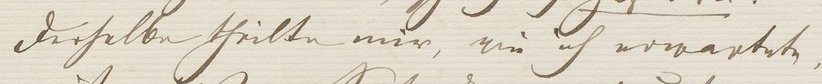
Derselbe theilte mir, wie ich erwartete,
